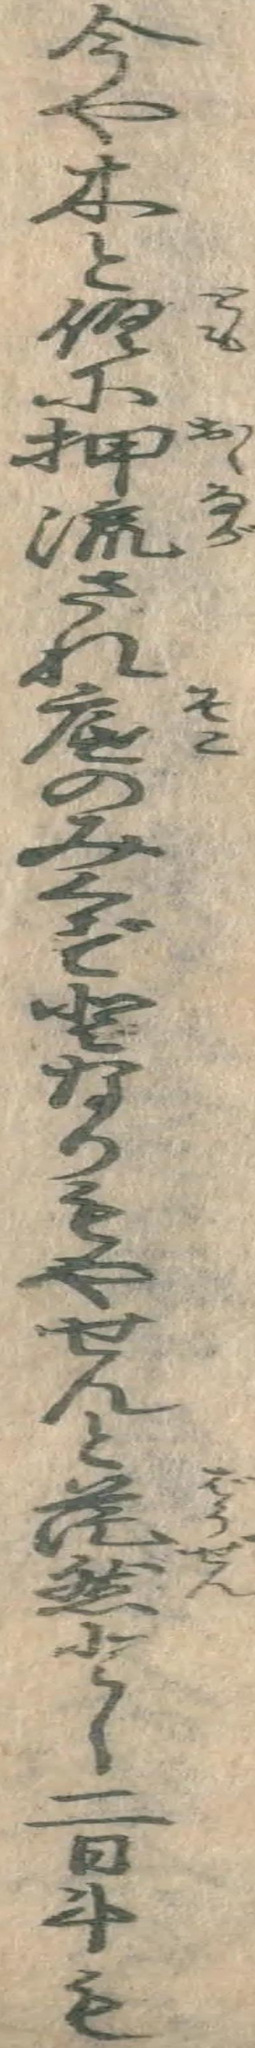今や木と倶に押流され底のみくずとなりもやせんと茫然とし二日斗も
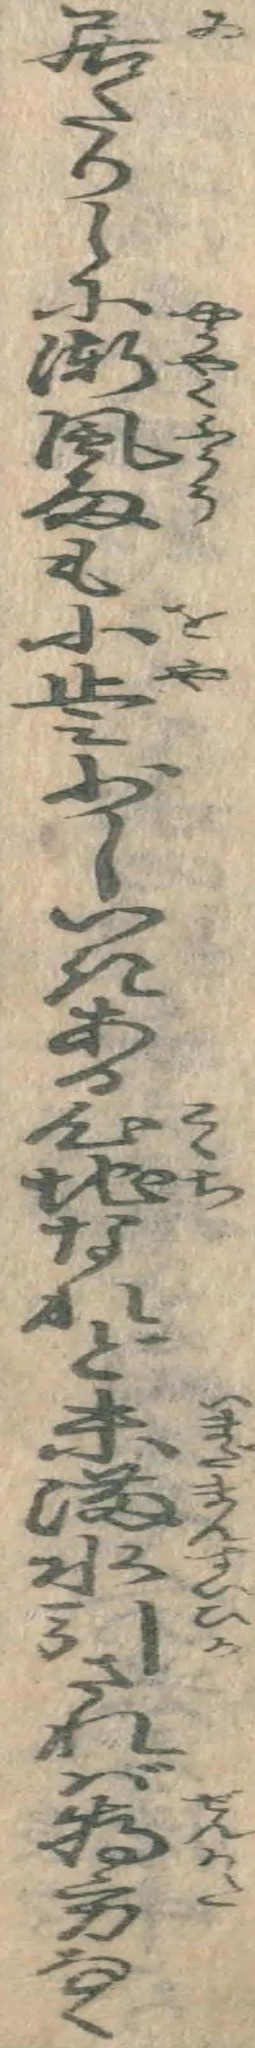居たりしに漸風雨も小止み少しいきある心地なれど未満水引されば為方なく

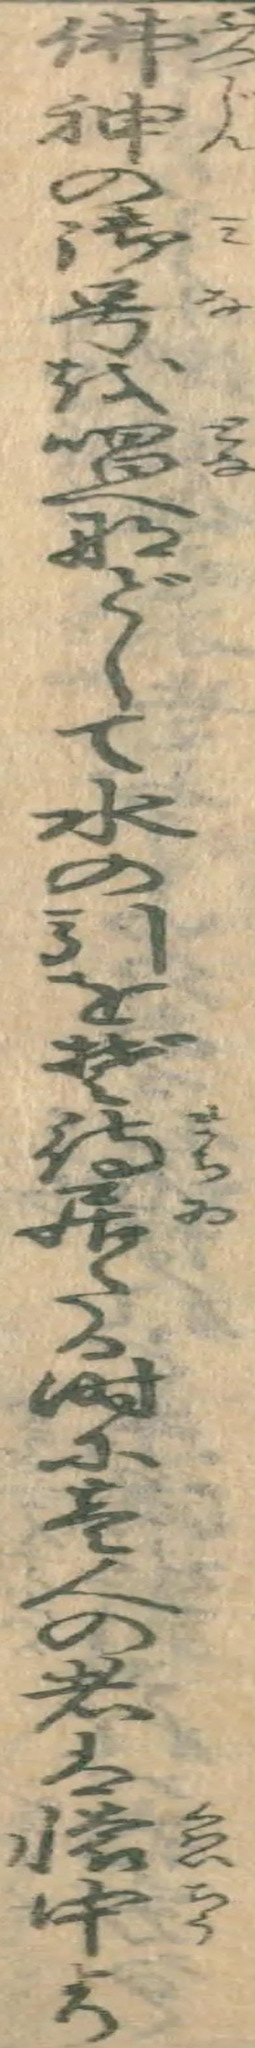仏神の御号を唱へなどして水の引をぞ待居たる時に壱人の者は懐中より
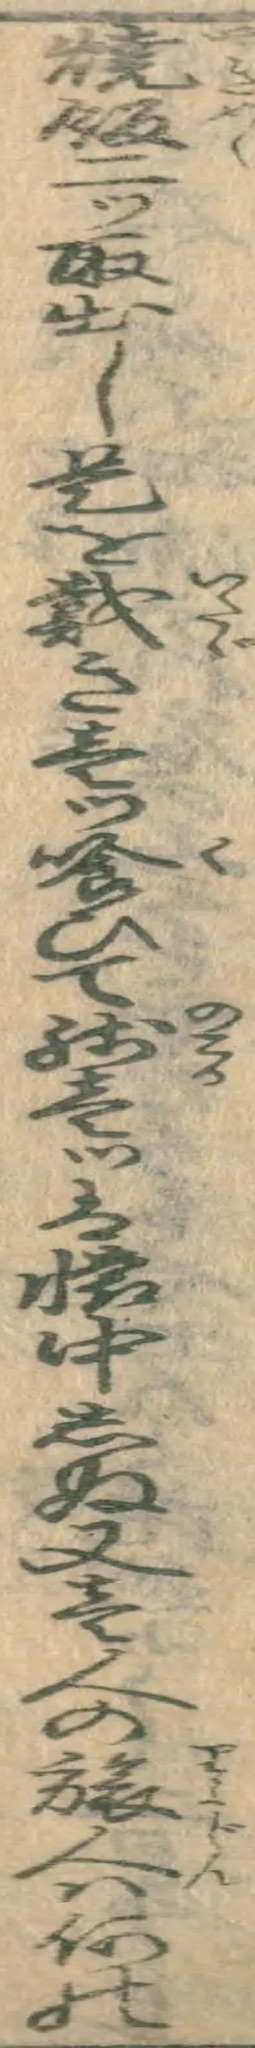焼飯二ツ取出し是を戴き壱ツ喰ひて残壱ツは懐中しぬ又壱人の旅人は何の
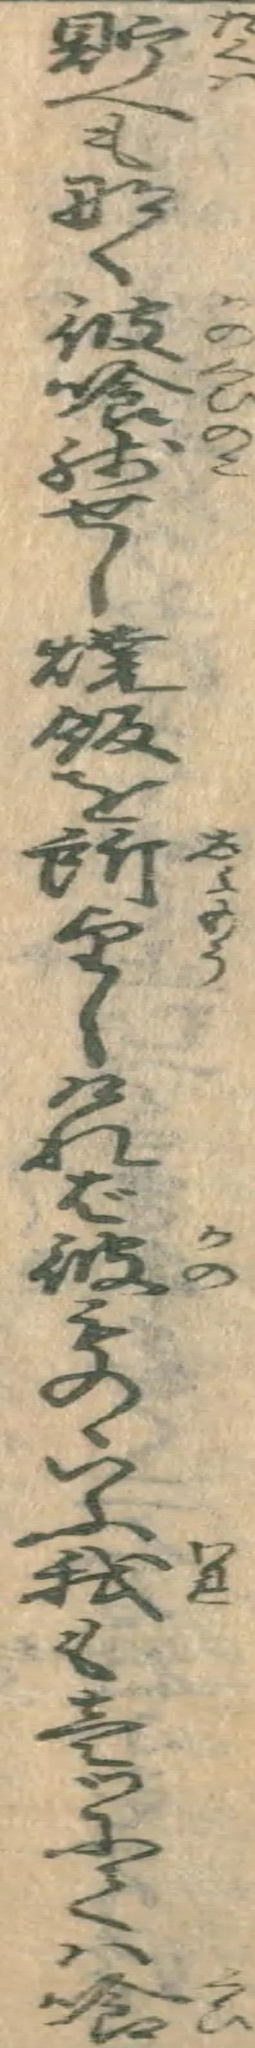貯へもなく彼喰残せし焼飯を所望しければ彼ものゝいふ我も壱ツにては喰
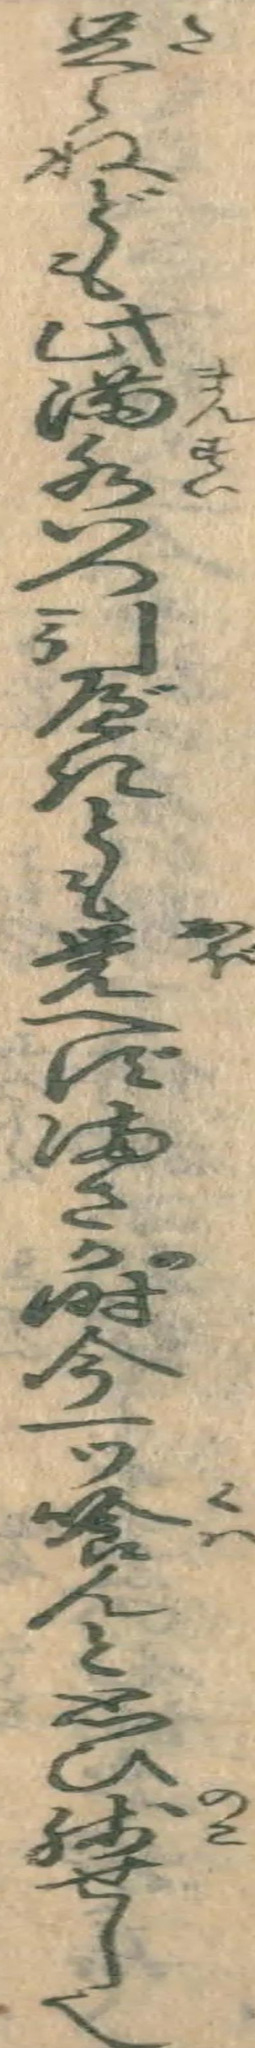足らねども此満水いつ引べきとも覚へずまさかの時今一ツ喰んと思ひ残せし也
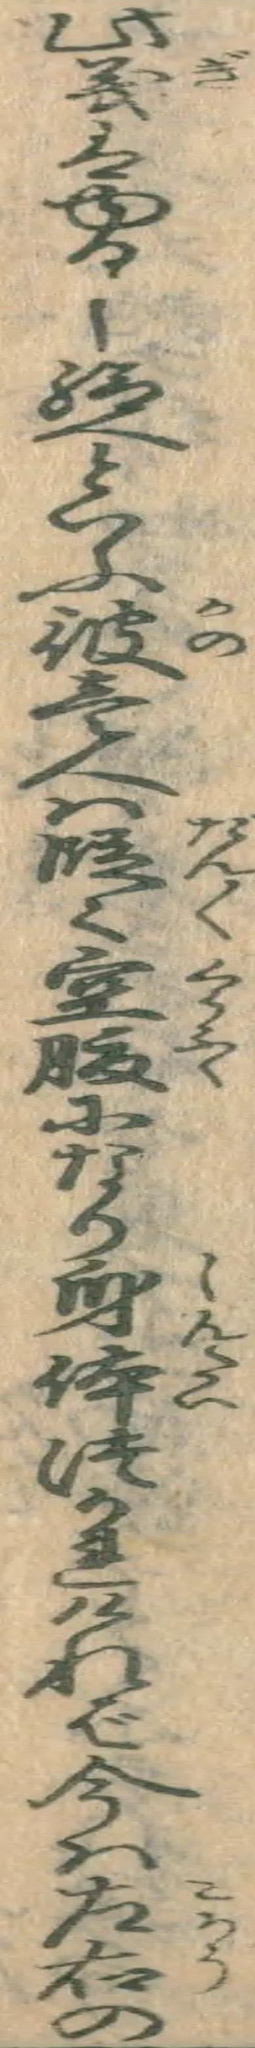此義はゆるし給へといふ彼壱人は段々空腹になり身体つかれければ今は左右の
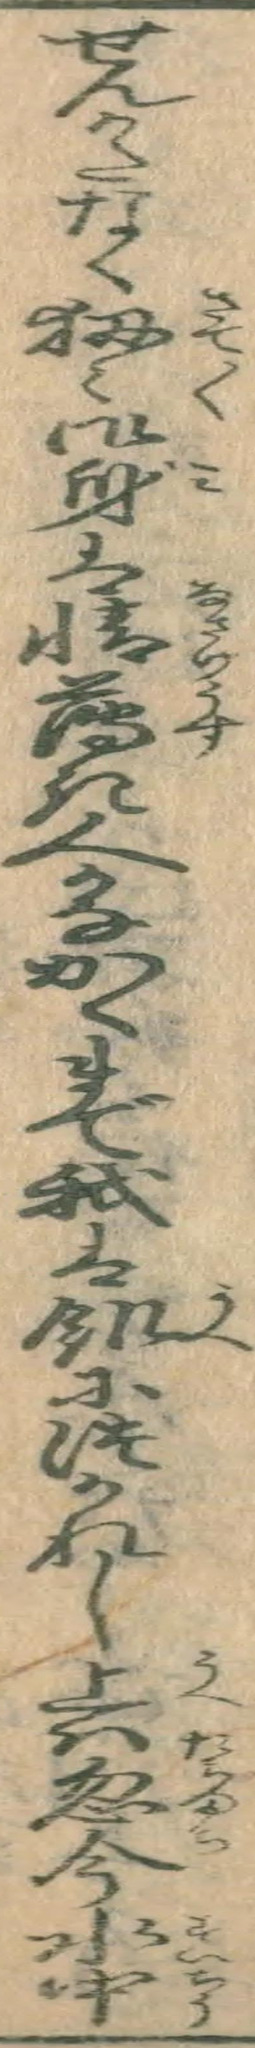せんかたなく扨々御身は情薄き人かなかくまで我は飢につかれし上は忽今水中
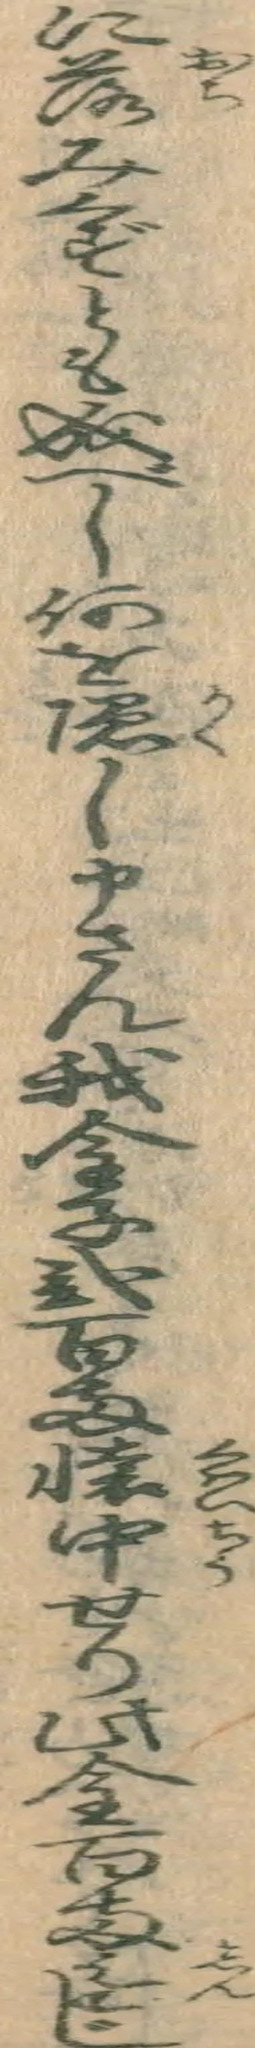に落みくずとも成べし何を隠し申さん我金子弐百両懐中せり此金百両進じ
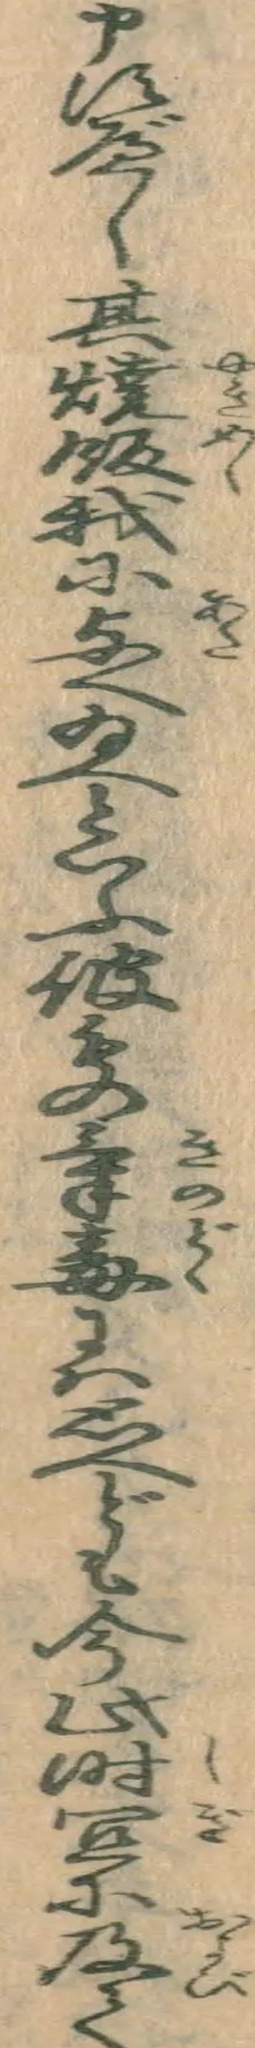申すべし其焼飯我に与へ給へといふ彼もの気毒には思へども今此時宜に及て
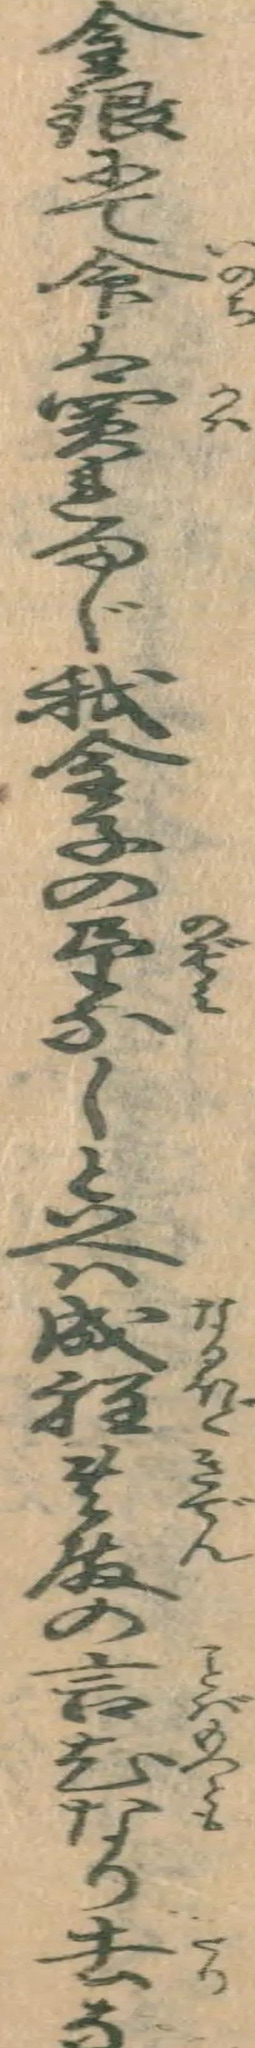金銀にて命は買れまじ我金子の望なしといヘは成程貴殿の言尤なり去な
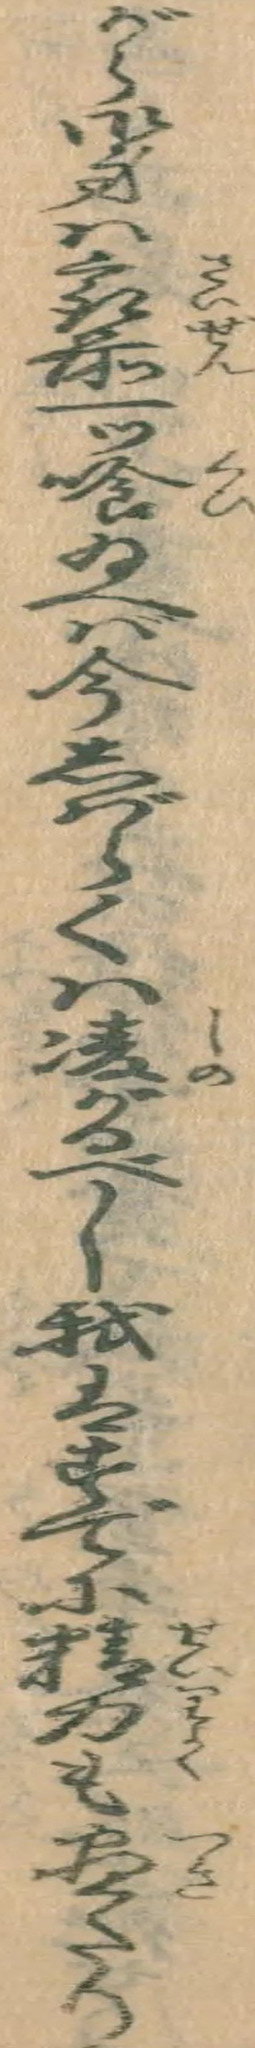がら御身は最前一ツ喰給ヘば今しばらくは凌がるべし我はすでに精力も尽たり
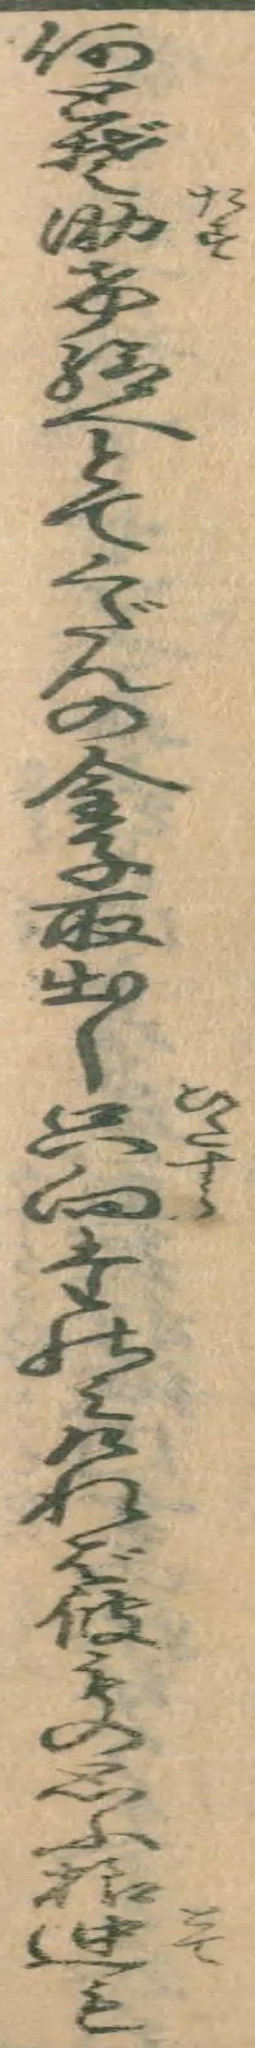何とぞ助け給へとてくだんの金子取出し只向たのみければ彼もの思ふ様迚も
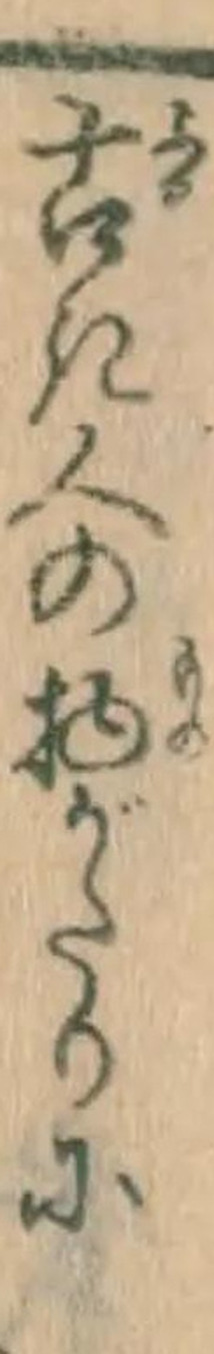古き人の物がたりに
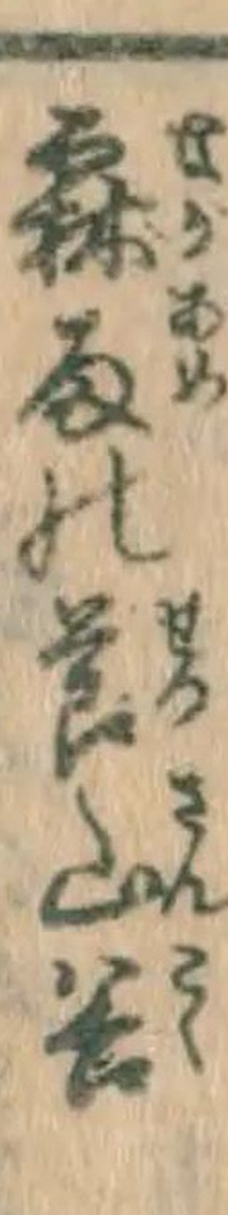霖雨の節山谷
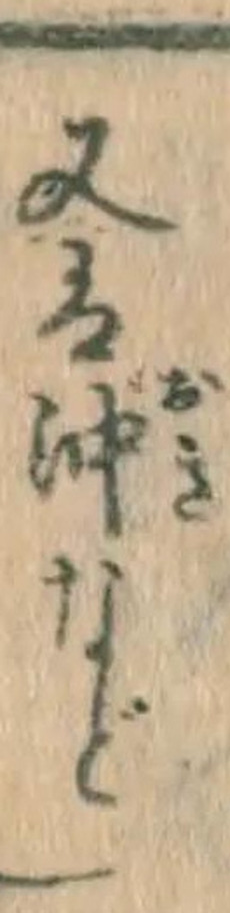又は沖など
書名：養蚕秘録 3巻. [3]
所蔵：国立国会図書館 National Diet Library, JAPAN
